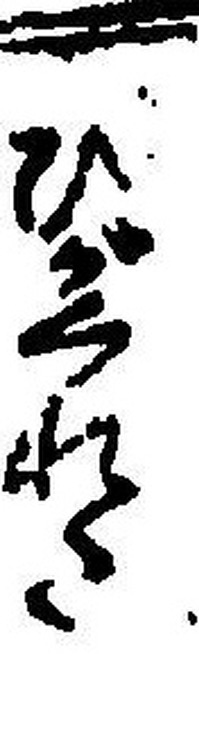ひがくれた
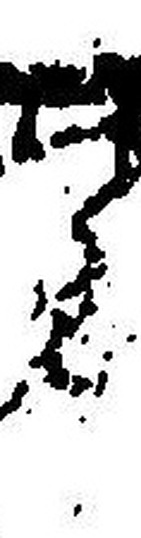つくは
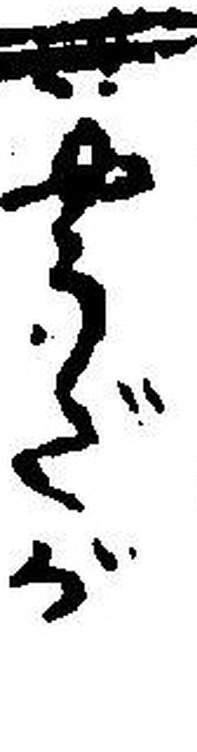やうだが
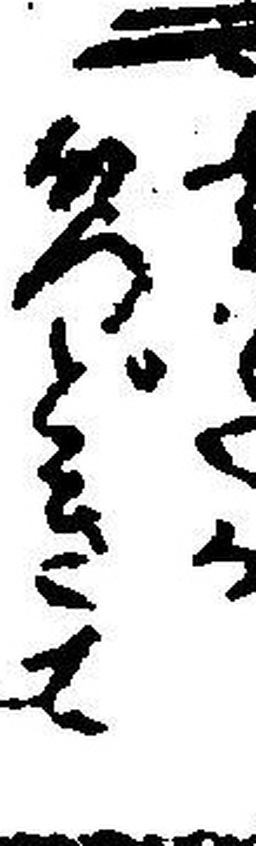なんどきて
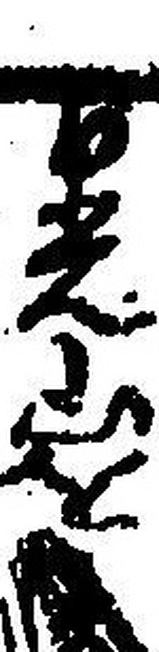日光山を
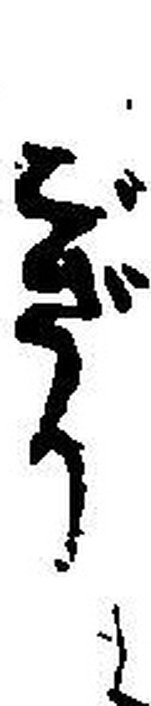ござり
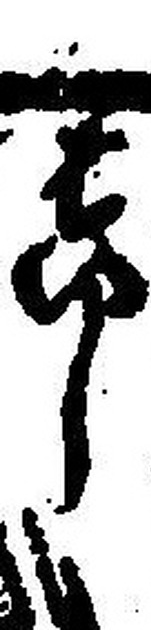はいし
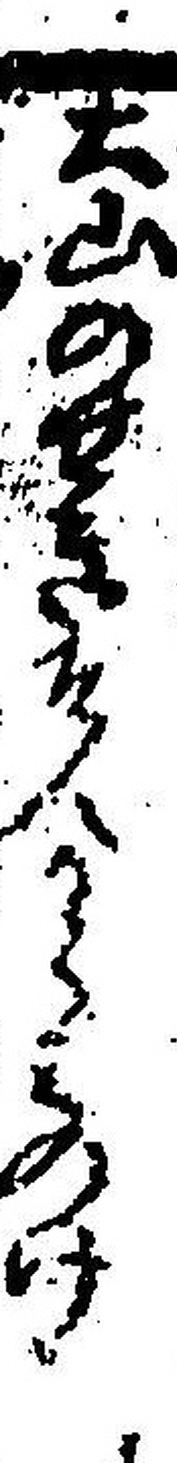大山のせきそんからみのけ
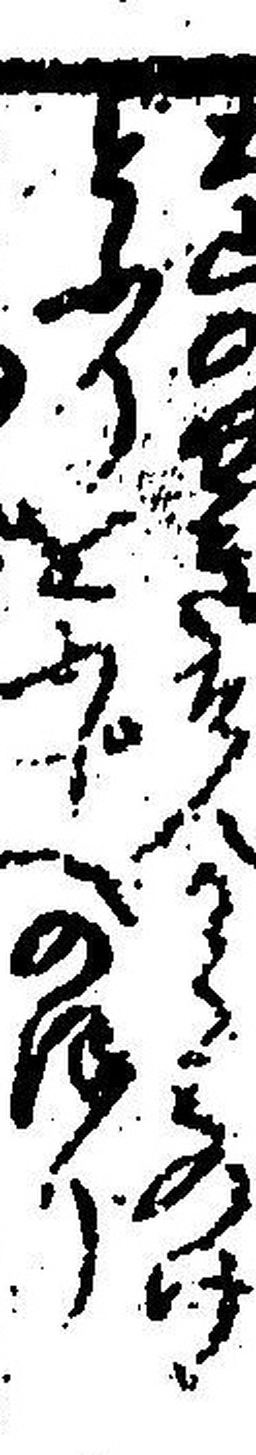とふりをふじへのほり
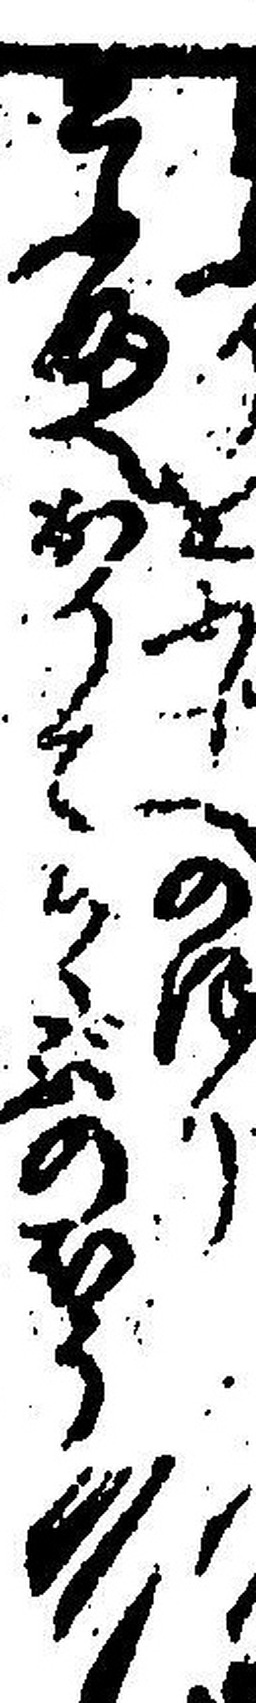こふふへおりてちゝぶのほう
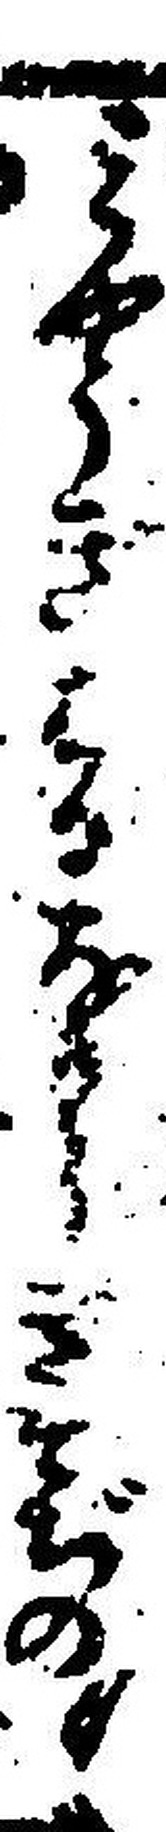みやうぎはるなからきそぢの
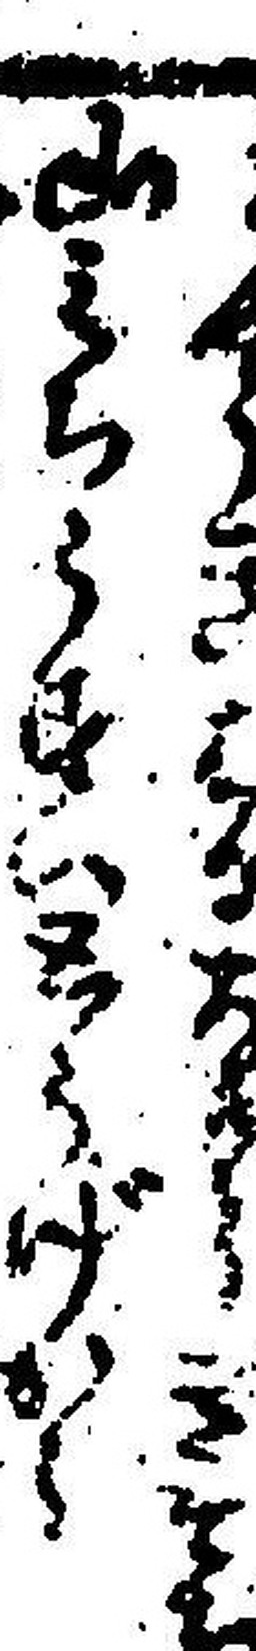山みちうすいとうげから
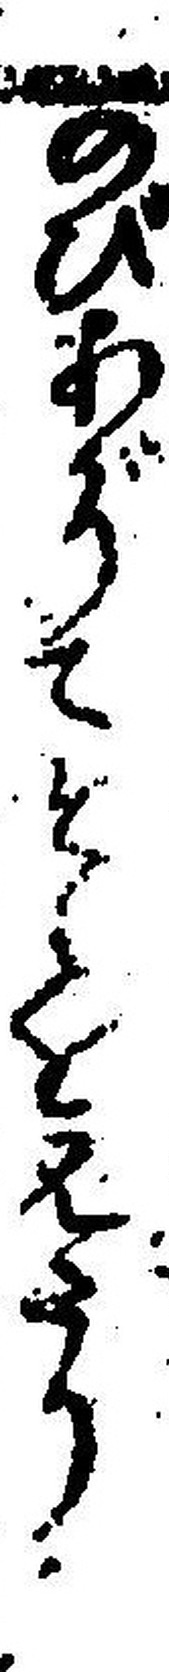のびあがりてそらを見たり
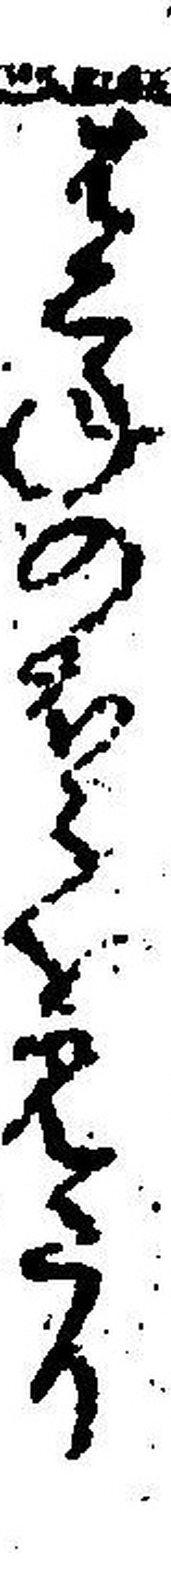はこねのほうを見たり
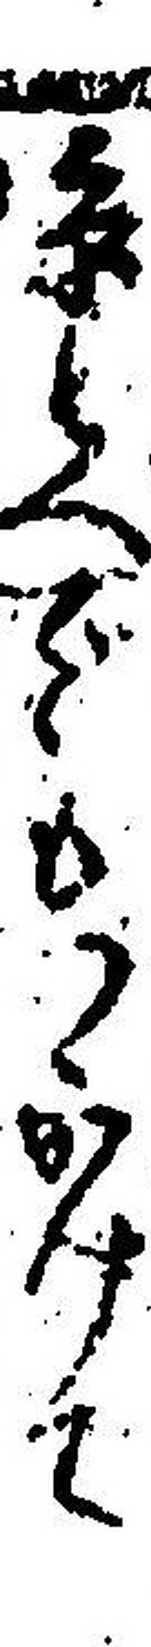京とへでもつゝかけて
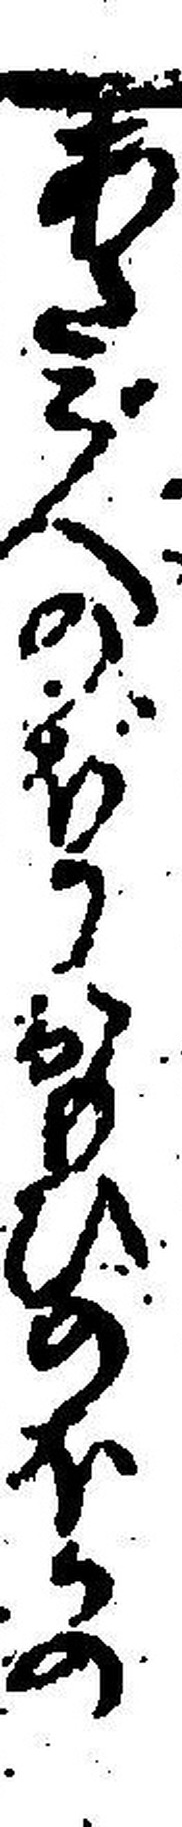あたごへのぼりおもひのほかの
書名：牡丹餅棚有 / 市場通笑作
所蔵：東京大学総合図書館 General Library in the University of Tokyo, JAPAN
